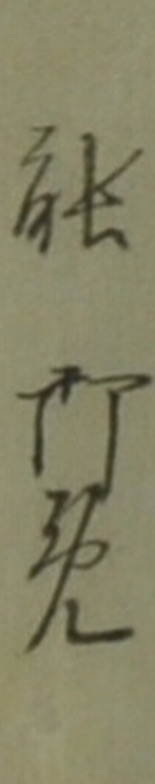能御免
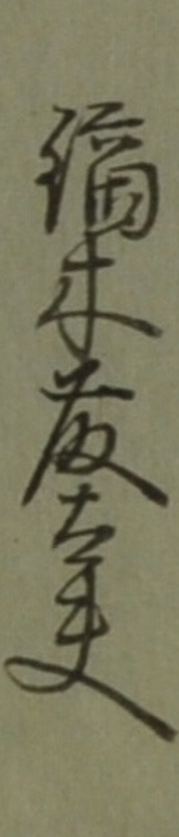鏑木藤太夫

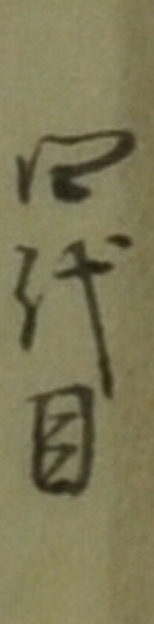四代目
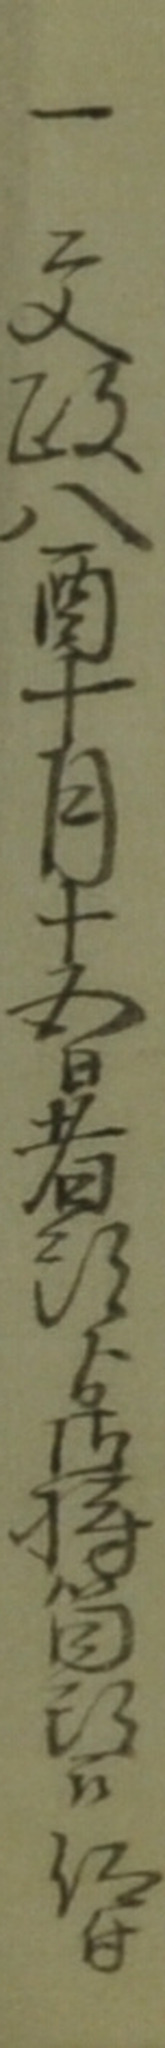一文政八酉十月十五日者頭ゟ御持筒頭被仰付
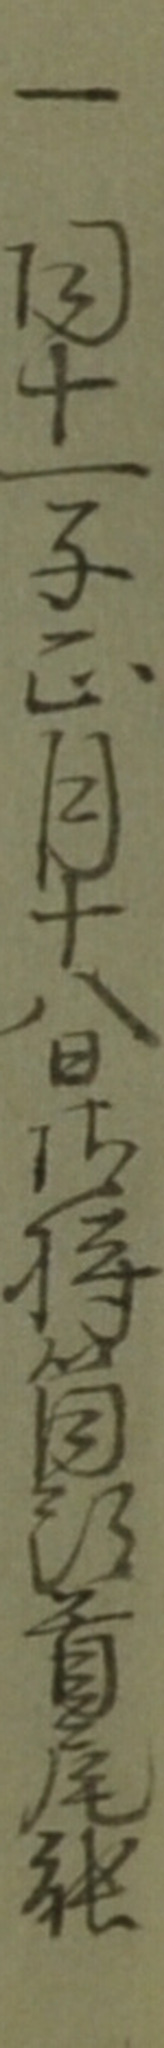一同十一子正月十八日御持筒頭首尾能
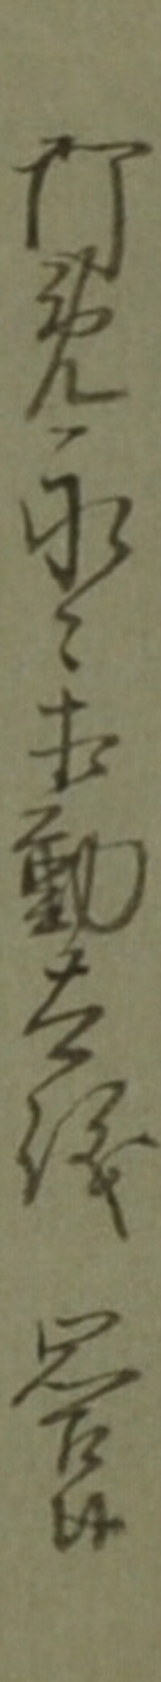御免永々相勤太儀思召候
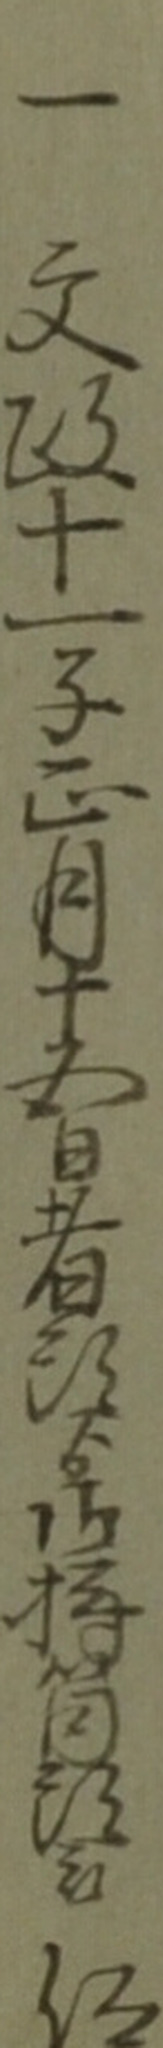一文政十一子正月十五日者頭ゟ御持筒頭被仰付
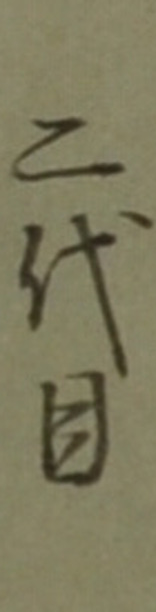二代目
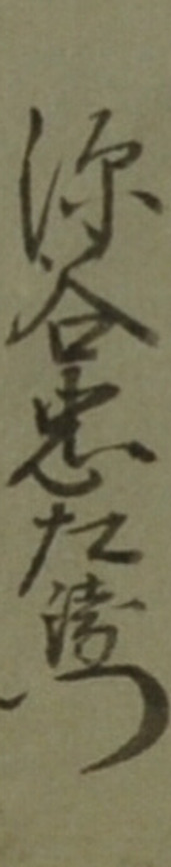深谷忠左衛門
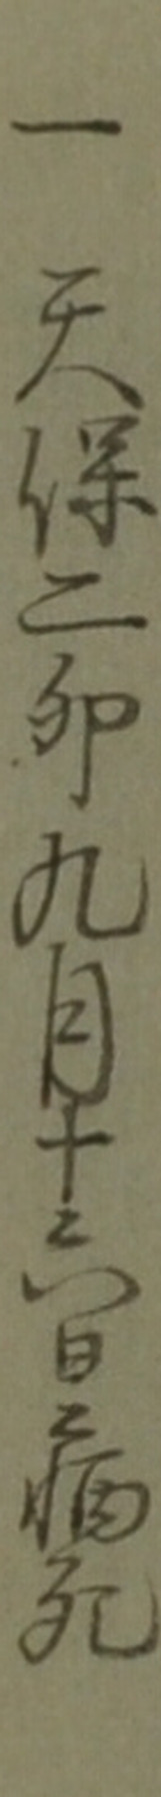一天保二卯九月十六日病死
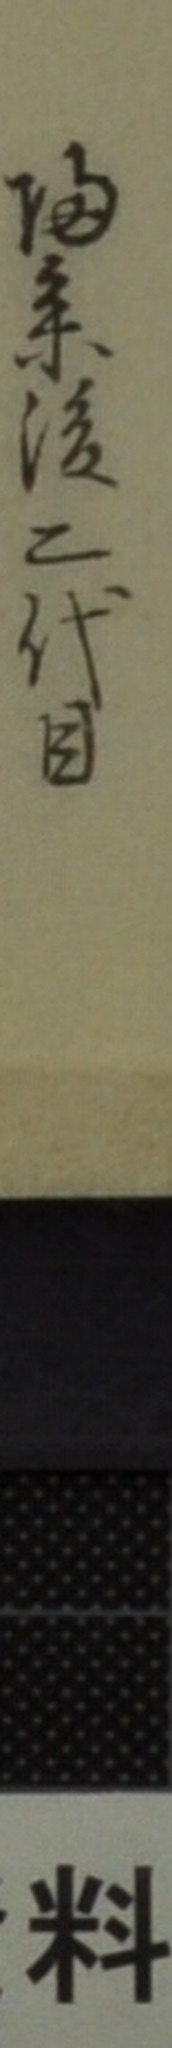帰参後二代目
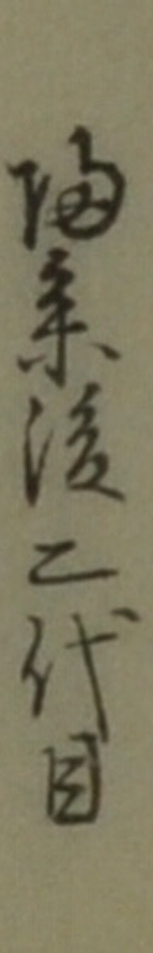帰参後二代目
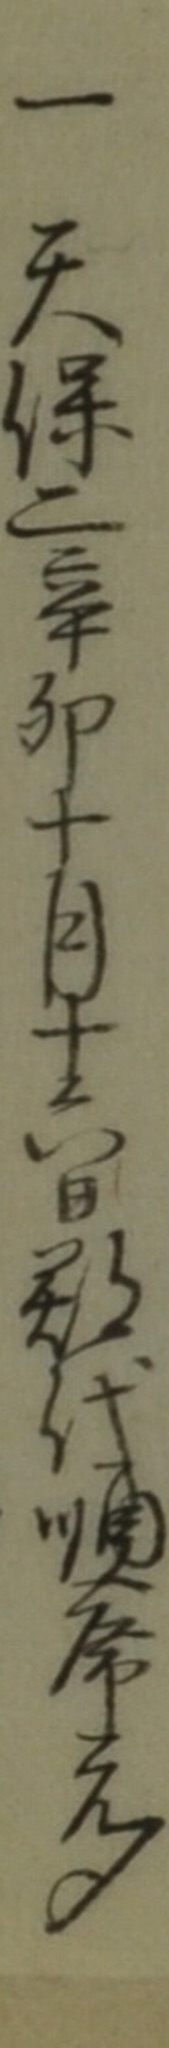一天保二辛卯十月十六日郡代順席元〆
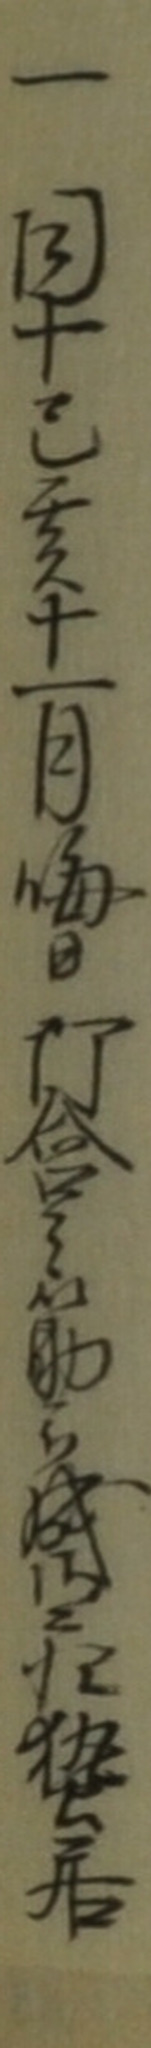一同十己亥十一月晦日御含之筋被成御座蟄居
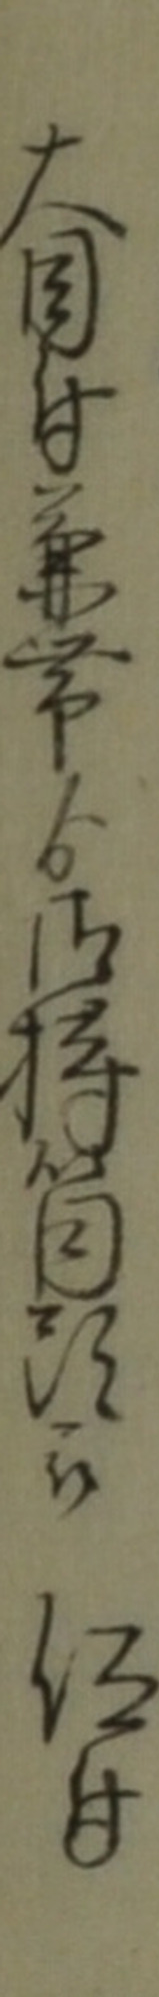大目付兼帯御持筒頭被仰付
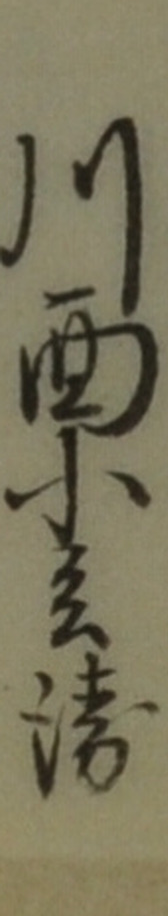川西小兵衛
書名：諸御役代々録（二）
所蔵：伊那市立高遠町図書館・合同会社AMANE
